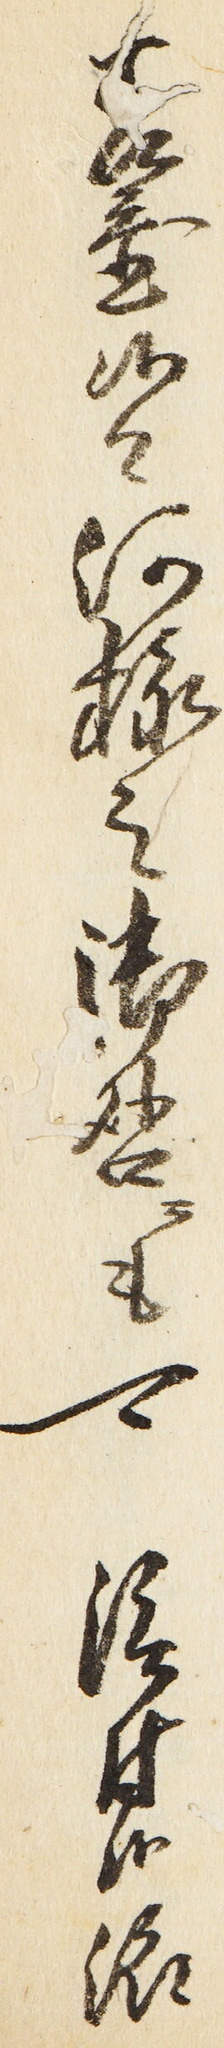差置候ハヽ何様之御咎ニも可仰付候依

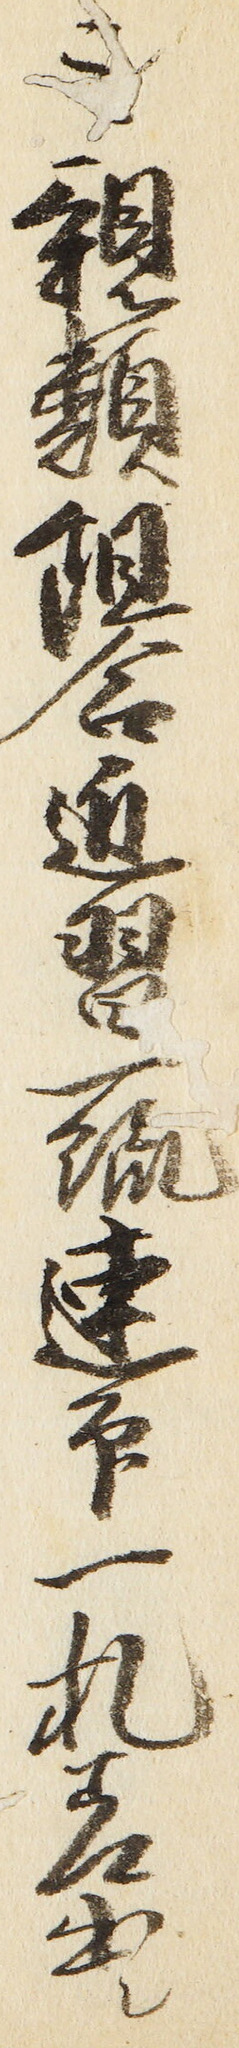之親類組合近習一統連印一札差出し
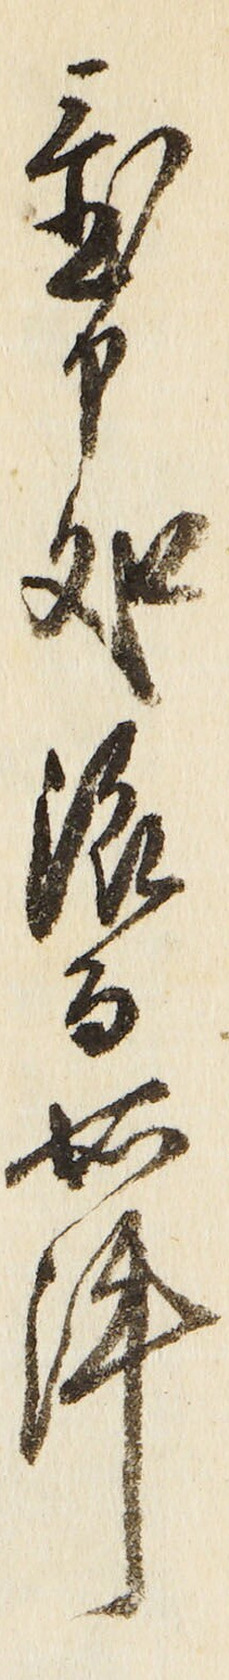置申処依而如件
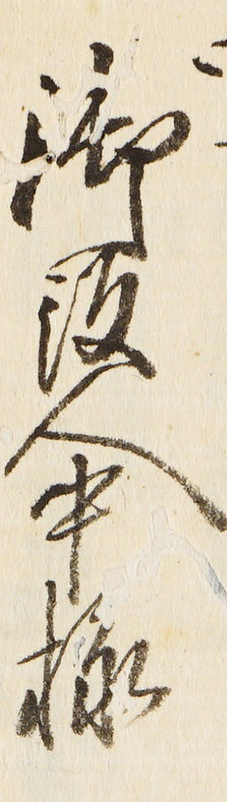御役人中様
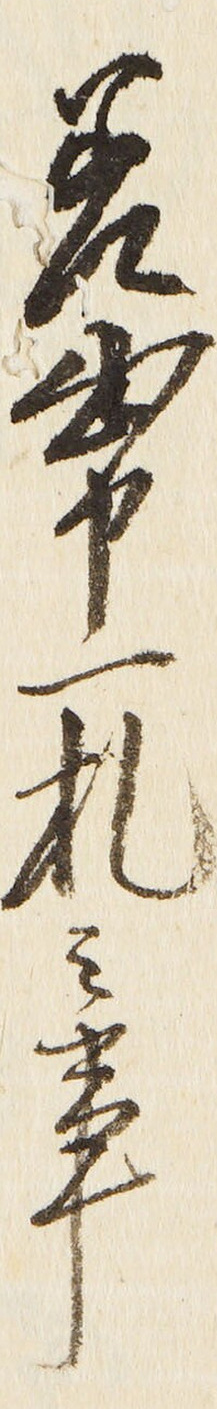差出申一札之事
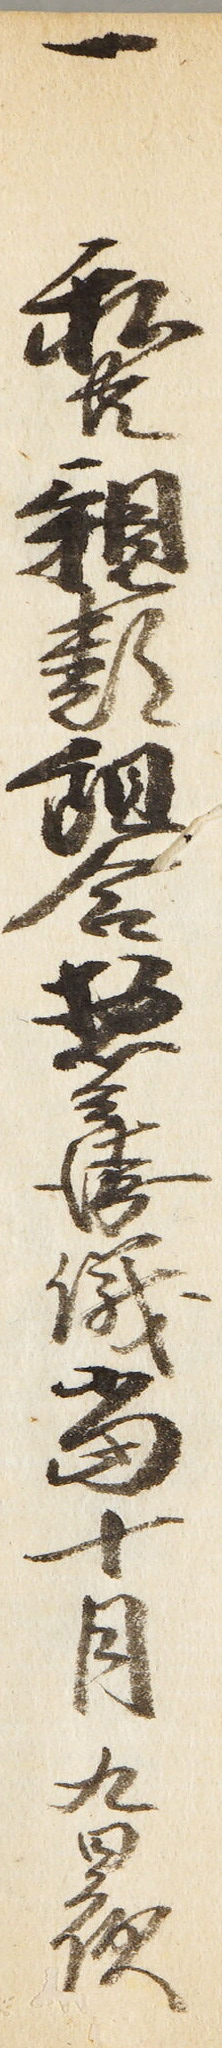一私共親類組合惣兵衛儀当十月九日夜
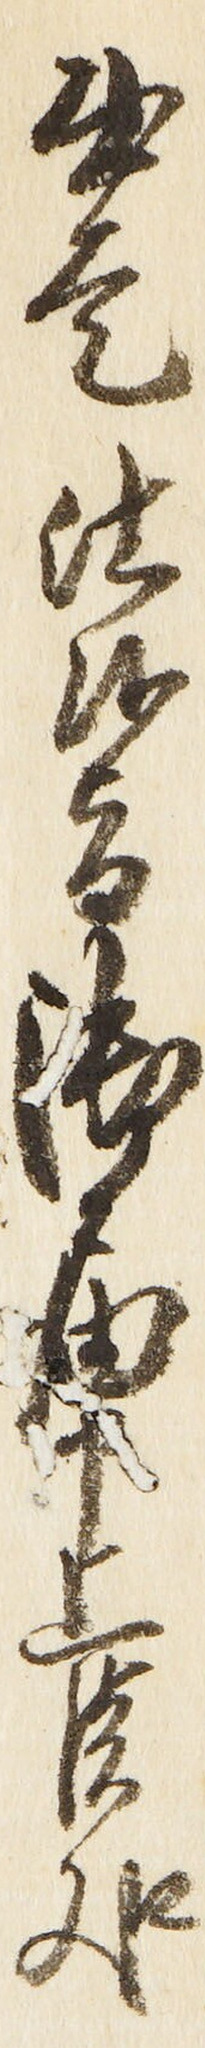出走仕候間御届申上候処
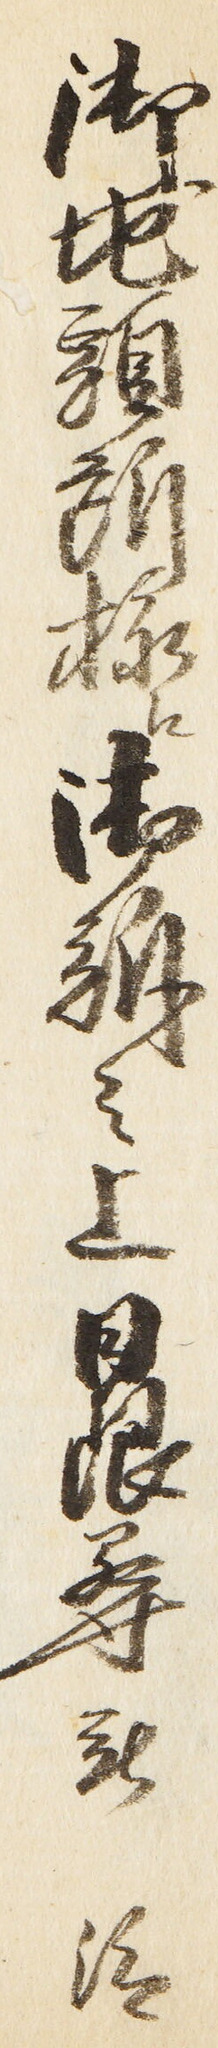御地頭所様江御訴之上日限尋被仰
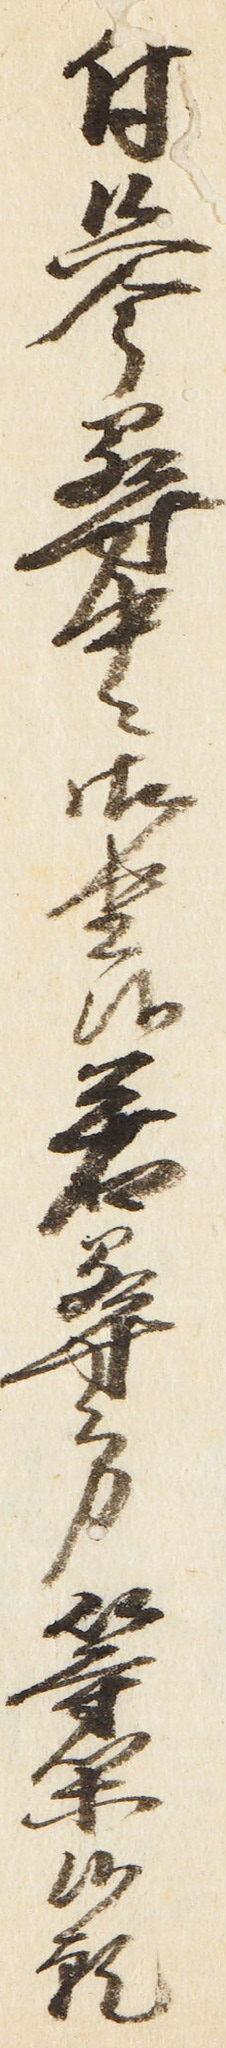付只今尋中ニ御座候若尋方等閑候歟
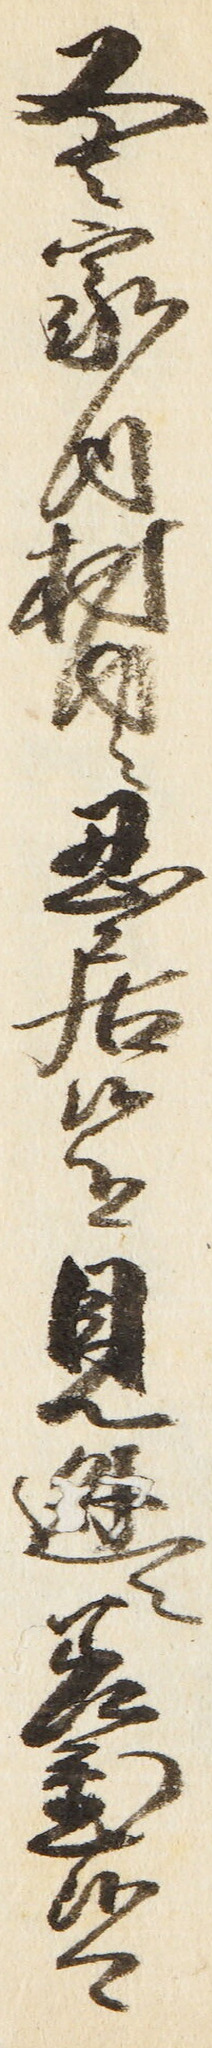又者家内村内ニ忍居候を見逃ニ差置候ハヽ
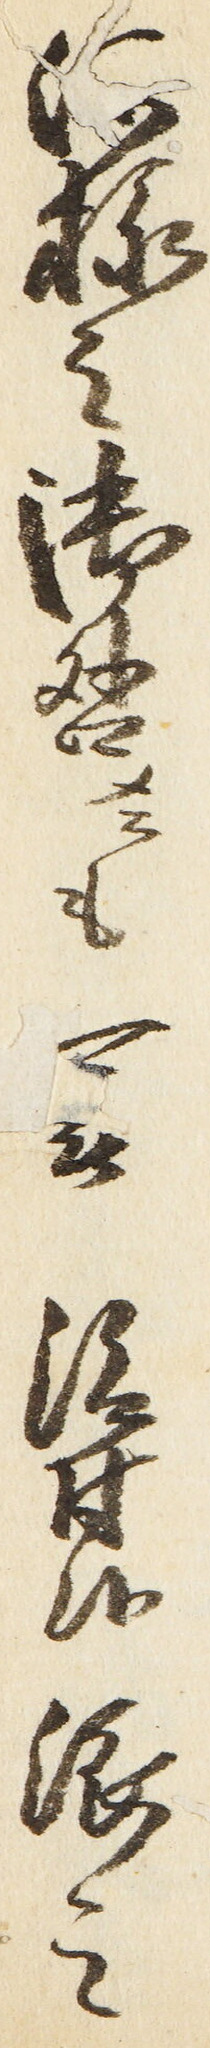何様之御咎メニも可被仰付候依之

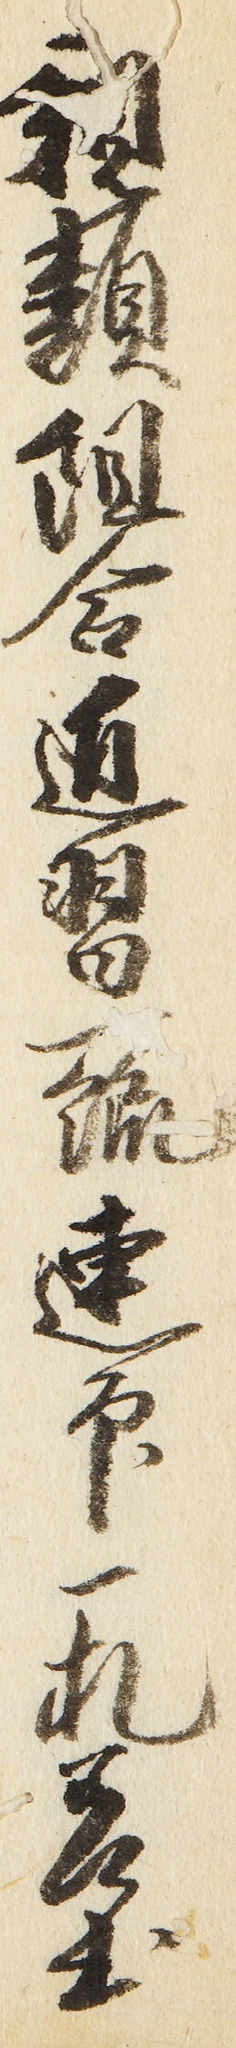親類組合近習一統連印一札差出
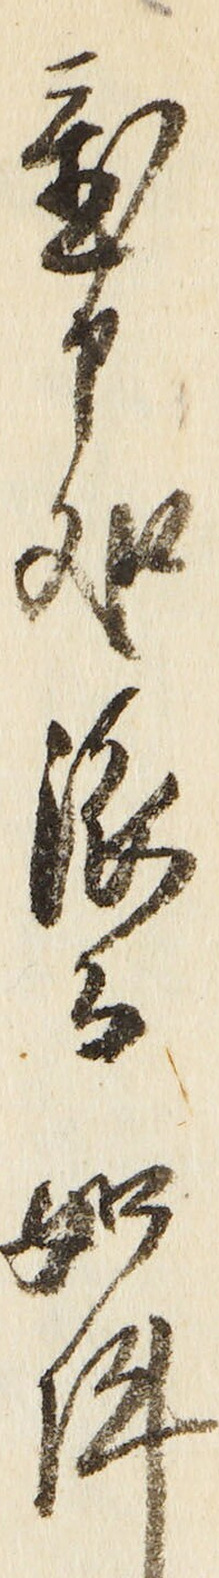置申処依而如件
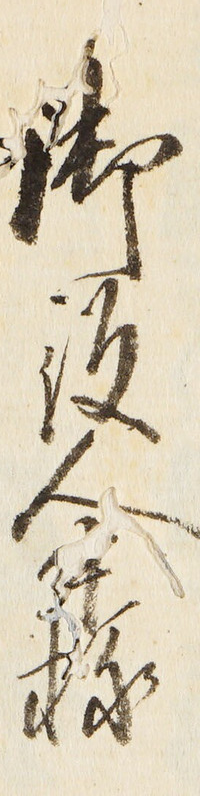御役人中様
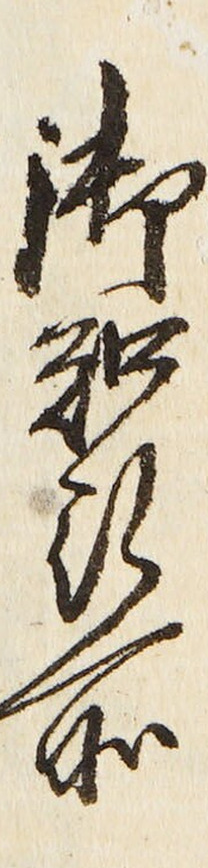御知行所
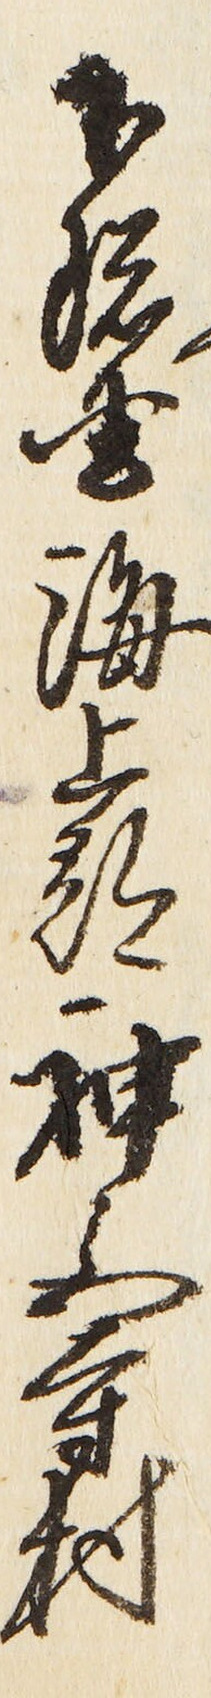下総国海上郡神宮寺村
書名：難船一件記録
